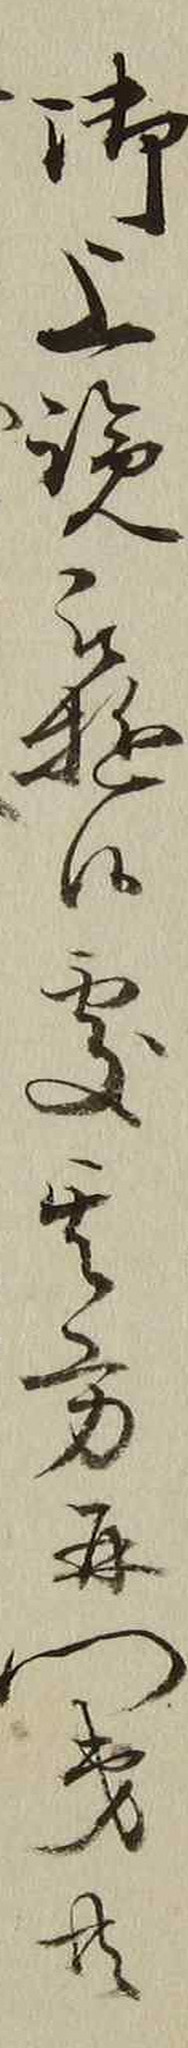御上覧被遊候処其方并門弟共
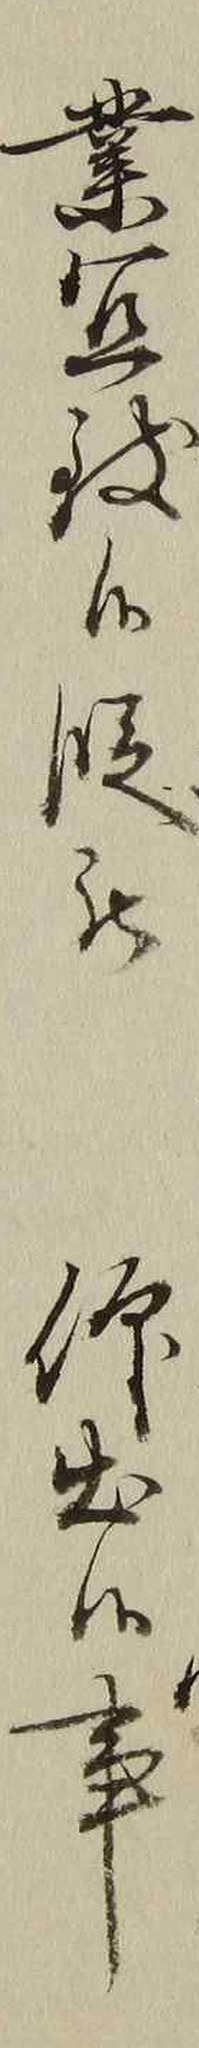業宜致候段被仰出候事
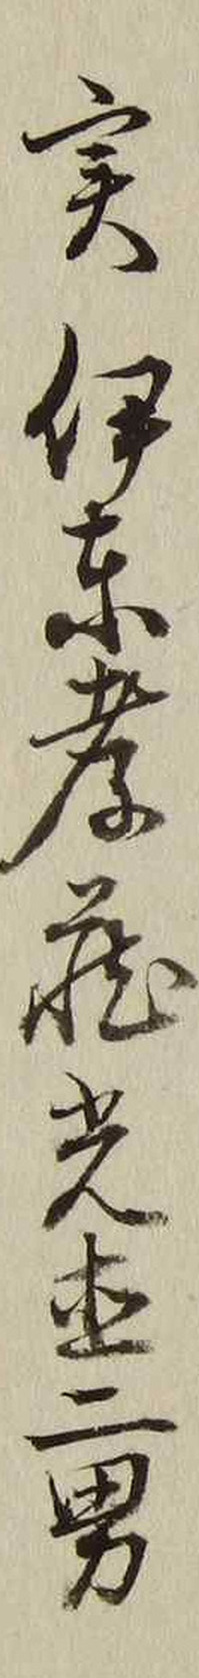実伊東孝蔵光直二男

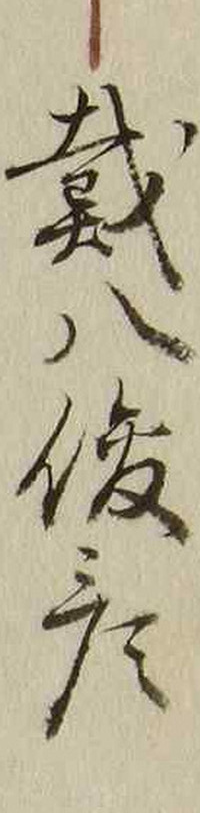戴八俊彦
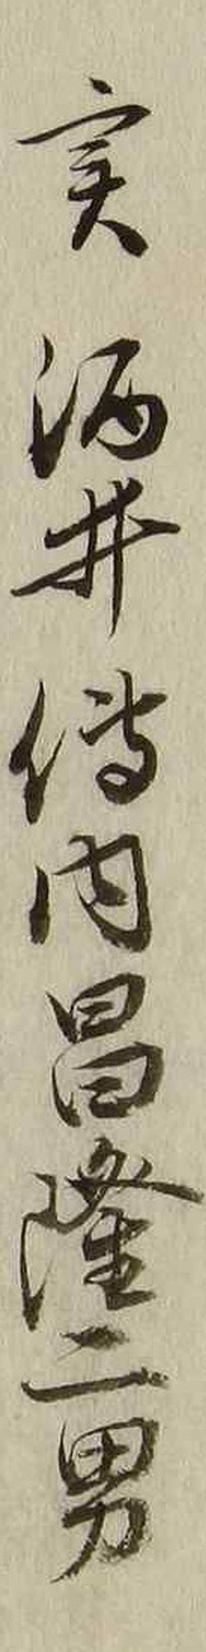実酒井伝内昌隆二男
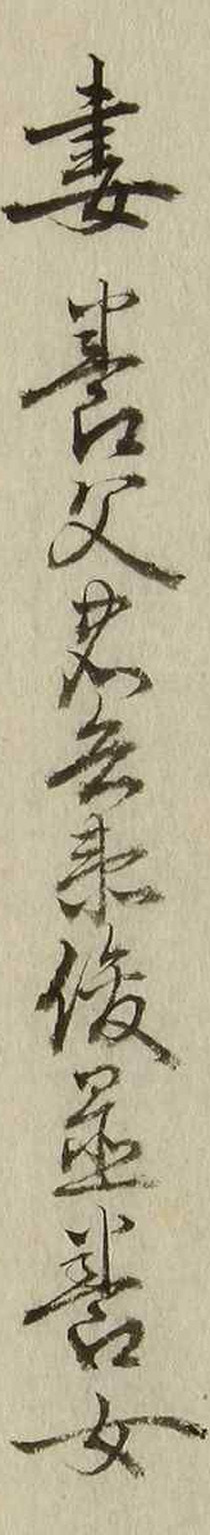妻養父忠兵衛俊置養女
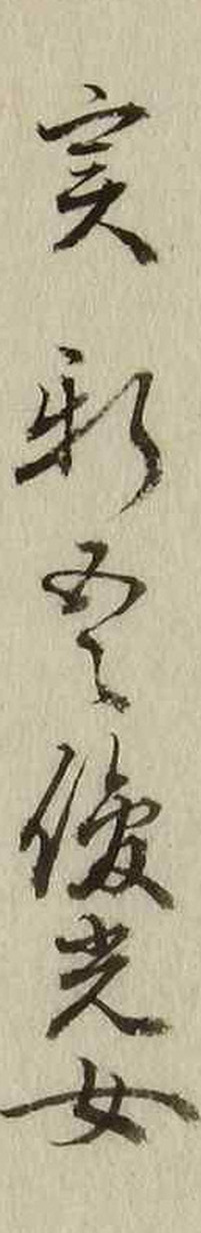実新吾俊光女
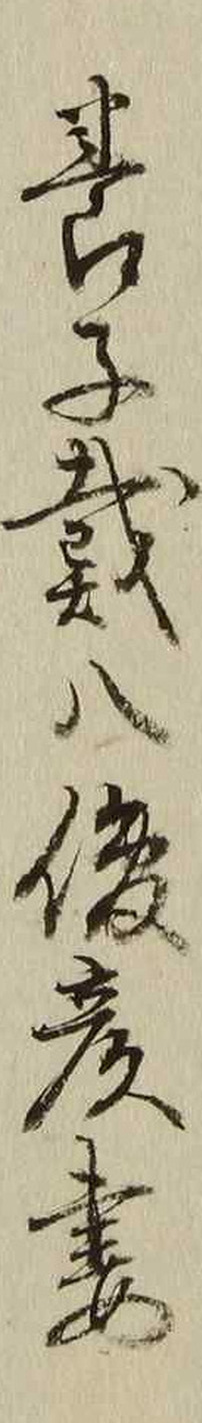養子戴八俊彦妻
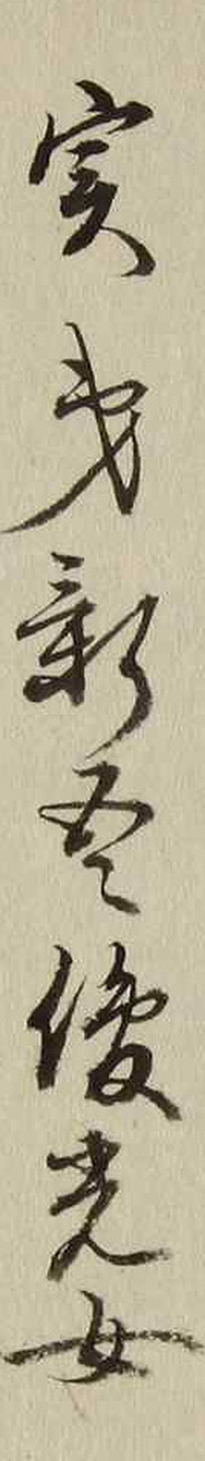実弟新吾俊光女
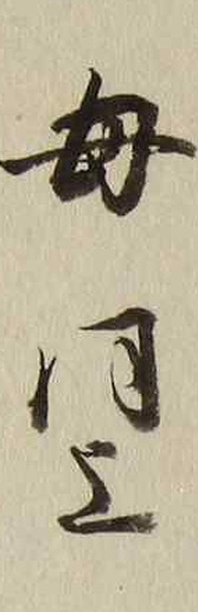母同上

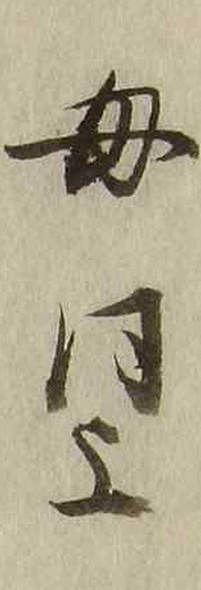母同上
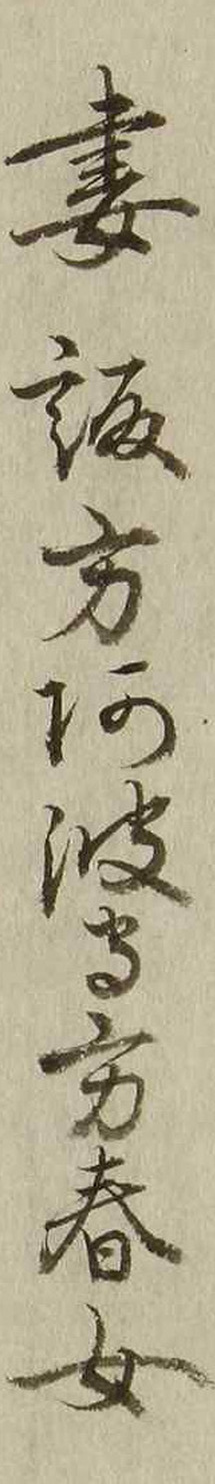妻諏方阿波守方春女
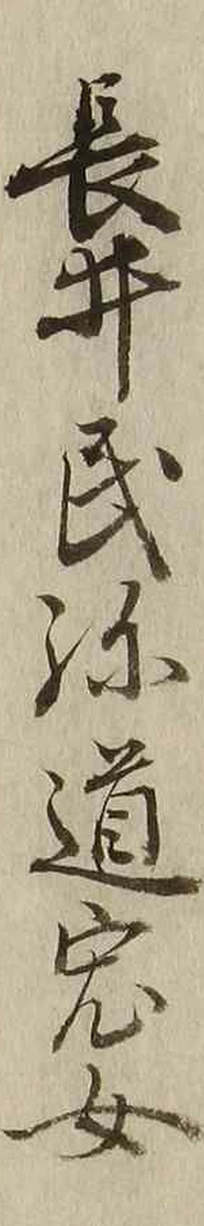長井民弥道宏女
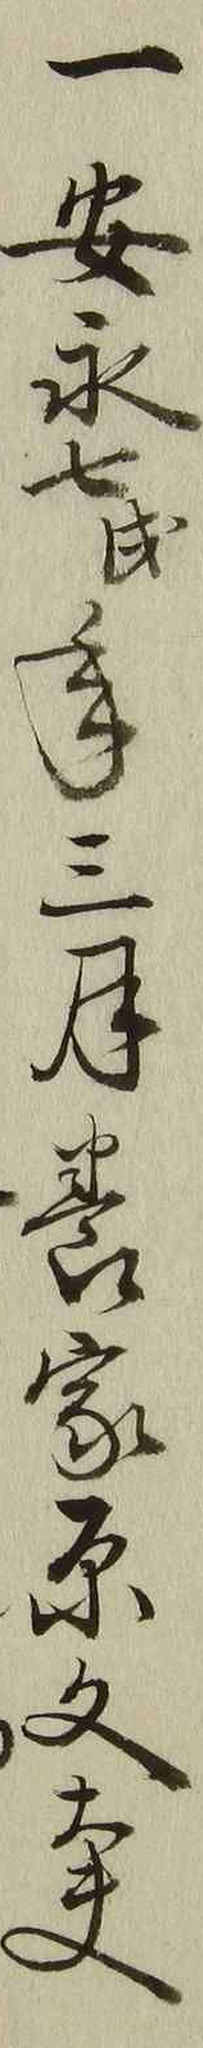一安永七戌年三月養家原久大夫
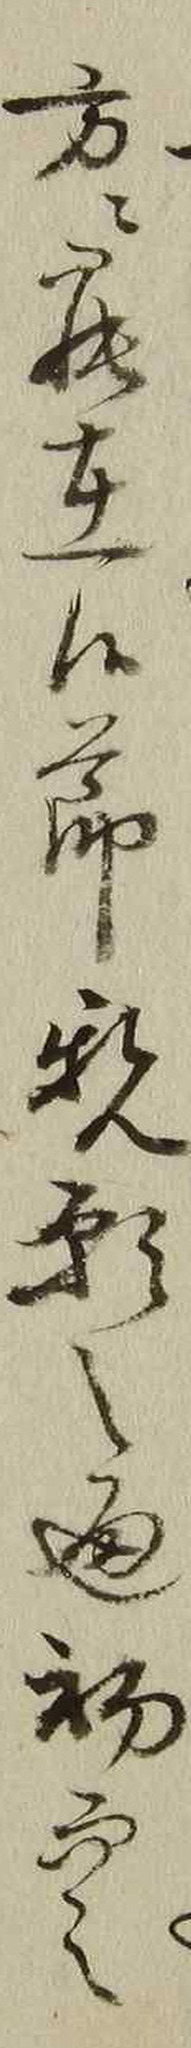方ニ罷在候節親願之通初而之
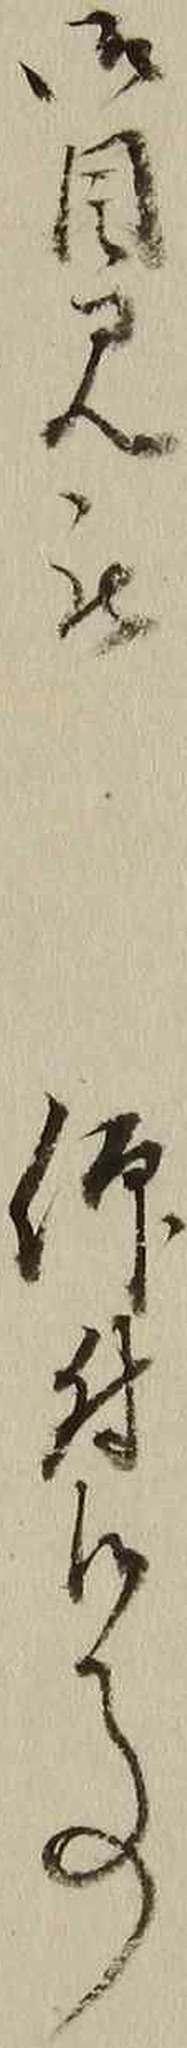御目見被仰付候事
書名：諸士系譜　巻之36　は之部4
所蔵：会津若松市立会津図書館
